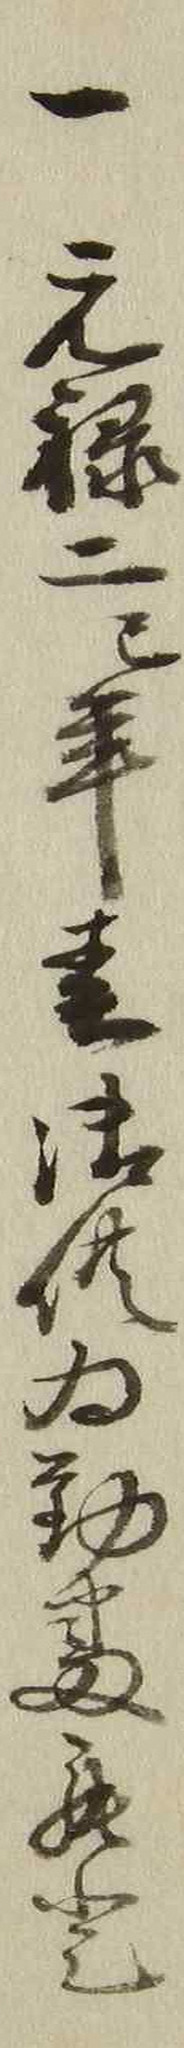一元禄二巳春御供為勤番罷登
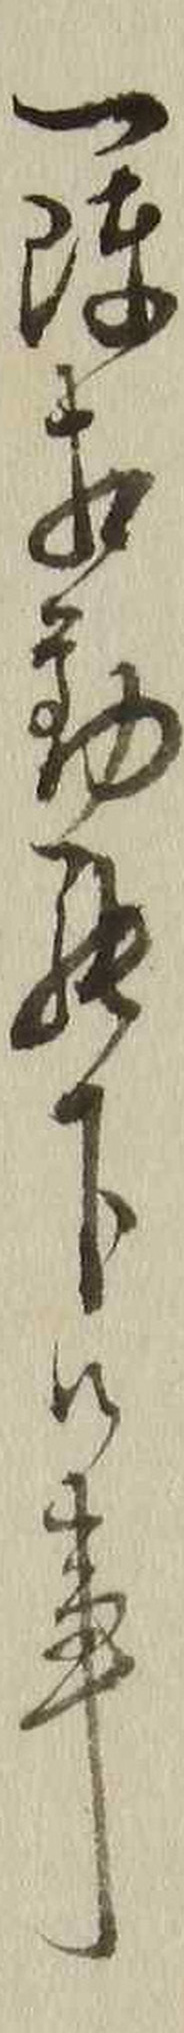一陣相勤罷下候事
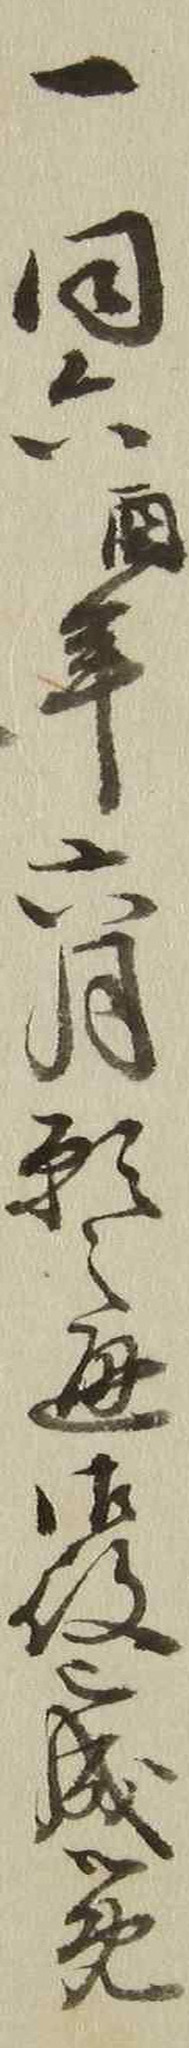一同六酉年六月願之通御役被成御免
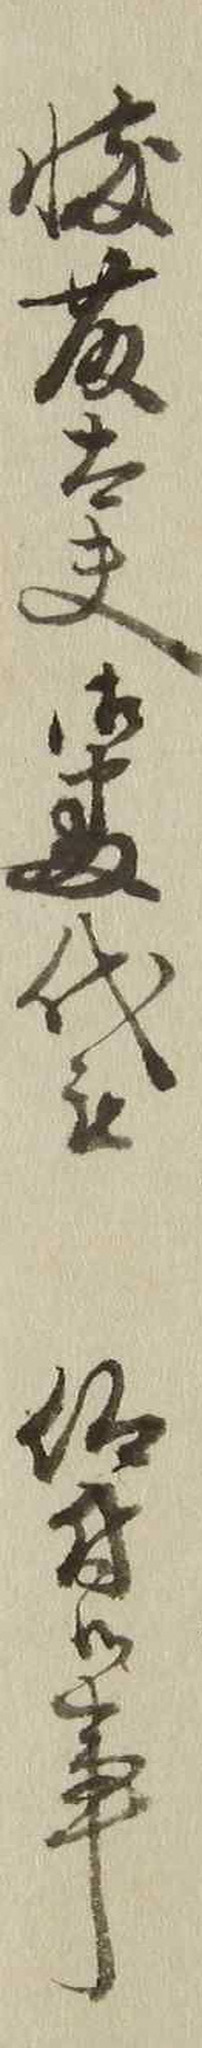忰藤太夫御番代被仰付候事
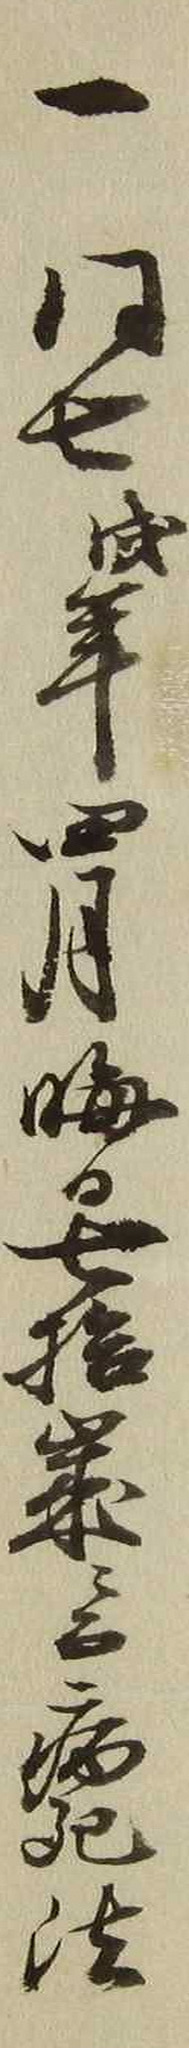一同七戌年四月晦日七拾歳ニ而病死法
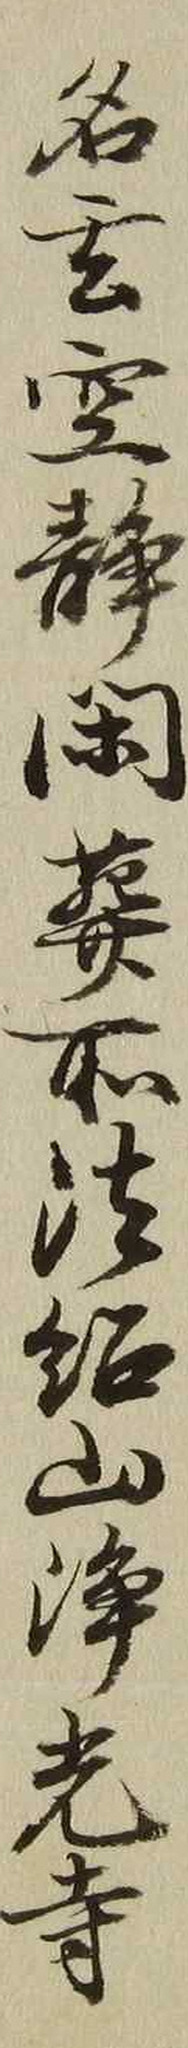名玄空静閑葬所法紹山浄光寺
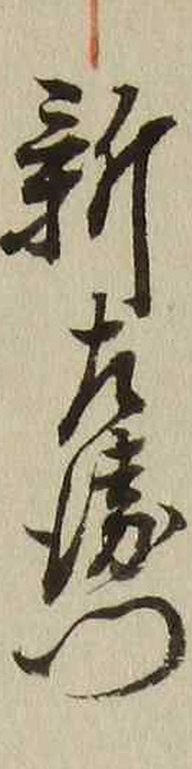新左衛門
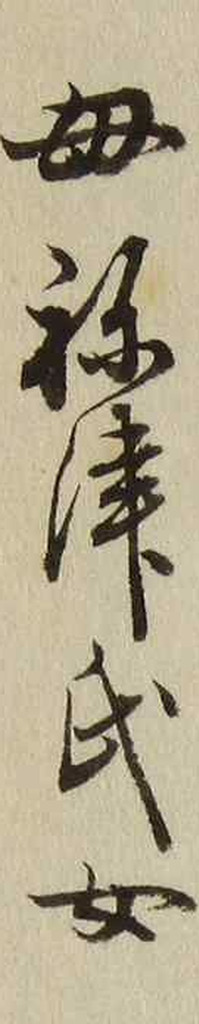母祢津氏女
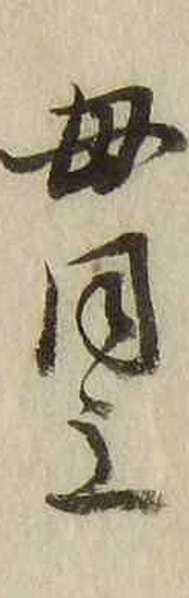母同上

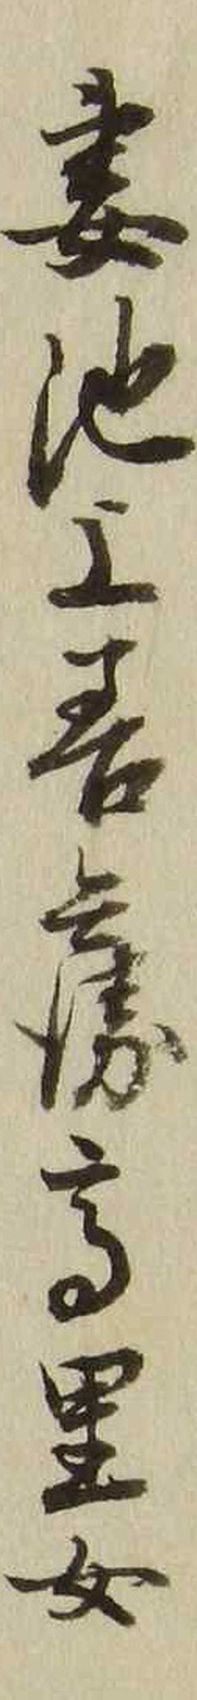妻池上善兵衛高里女
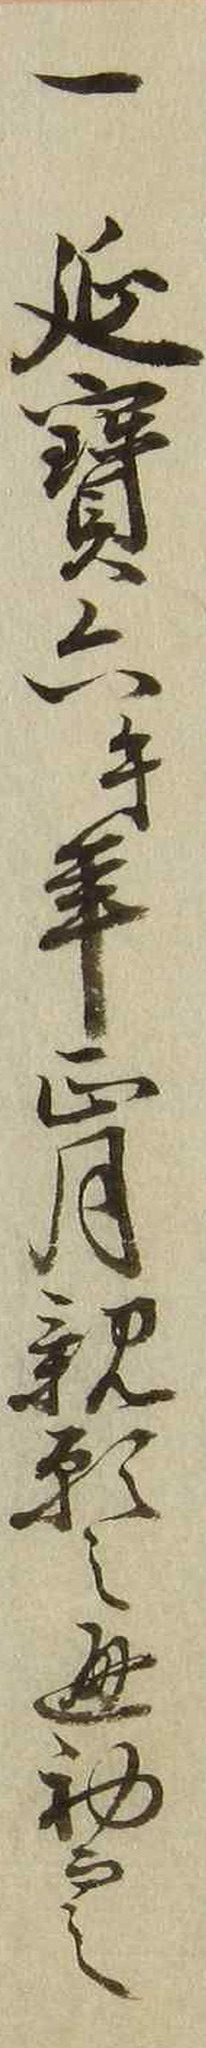一延宝六午年正月親願之通初而之
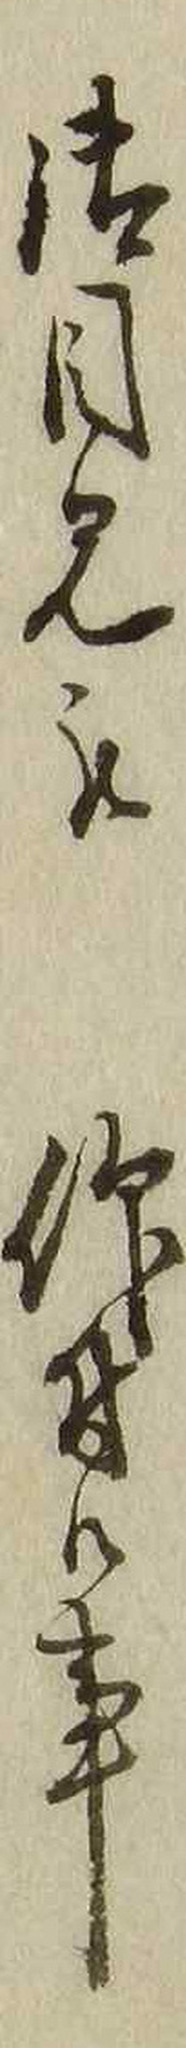御目見被仰付候事
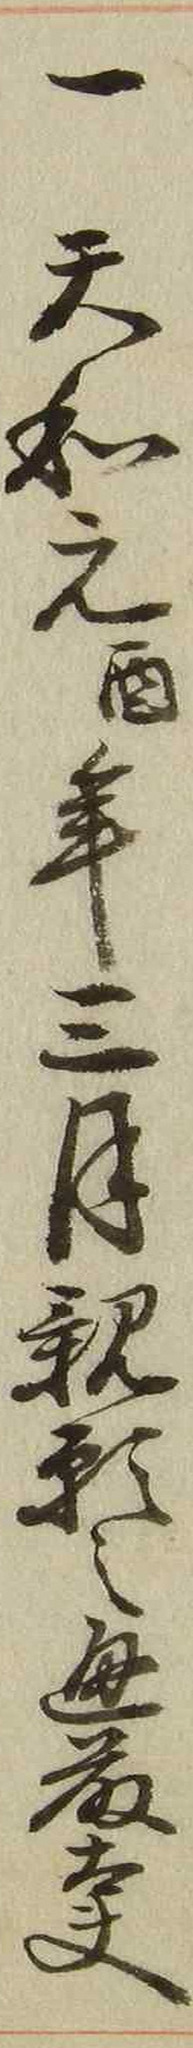一天和元酉年三月親願之通藤太夫
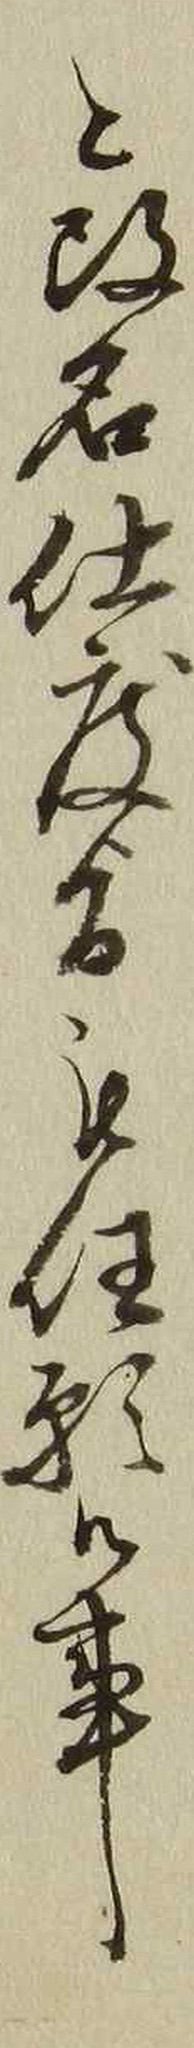と改名仕度旨被任願候事
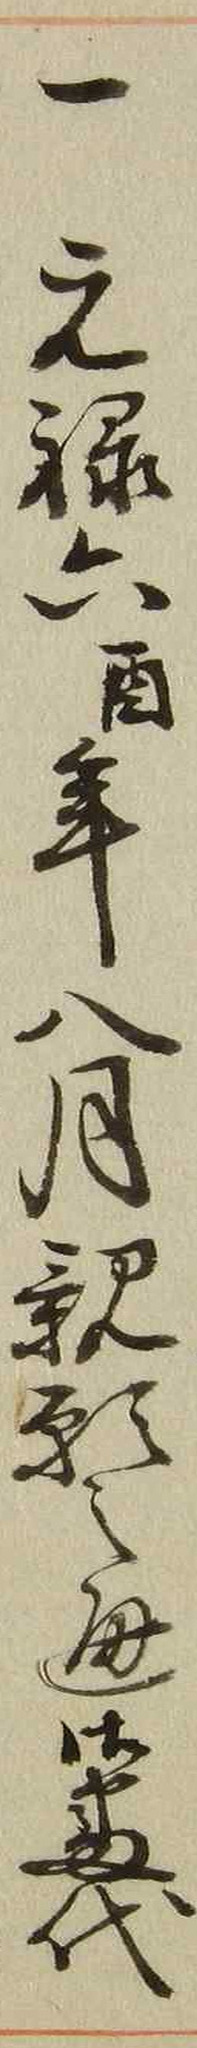一元禄六酉年八月親願之通御番代
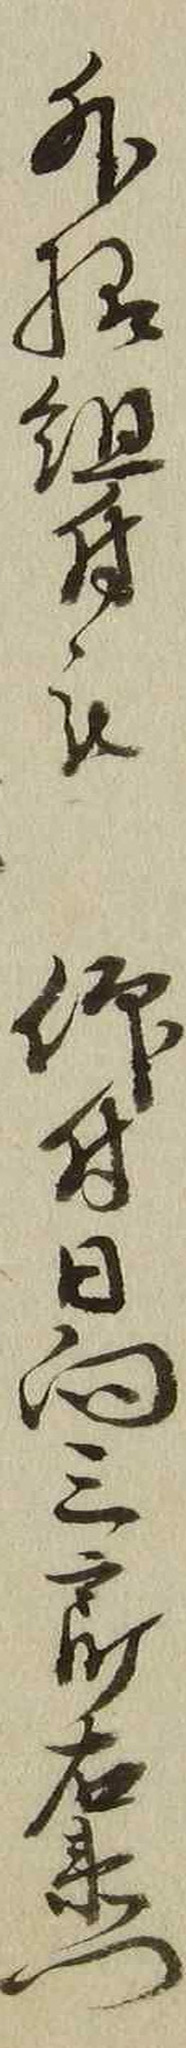外様組付被仰付日向三郎右衛門
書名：諸士系譜　巻之31　い之部31
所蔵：会津若松市立会津図書館
